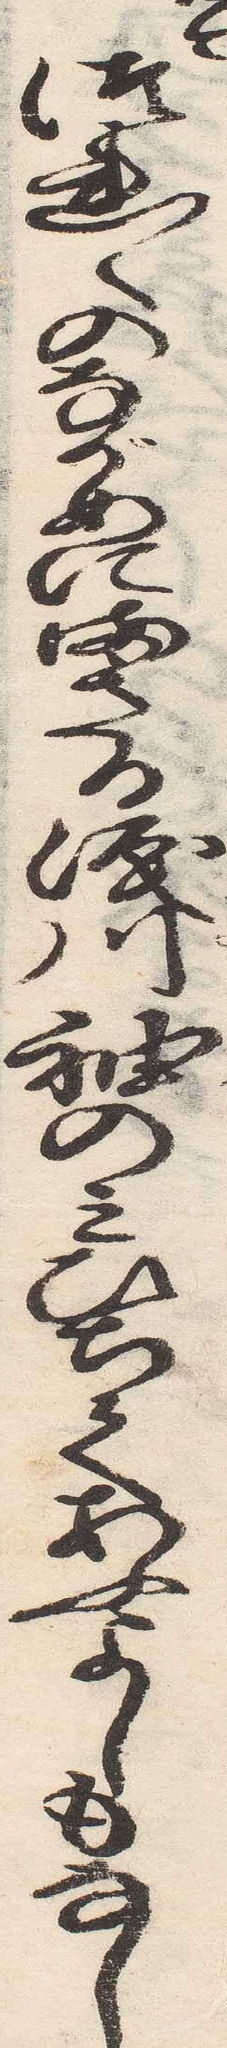古今つれ〳〵のながめにまさる涙川袖のみひちてあふよしもなし

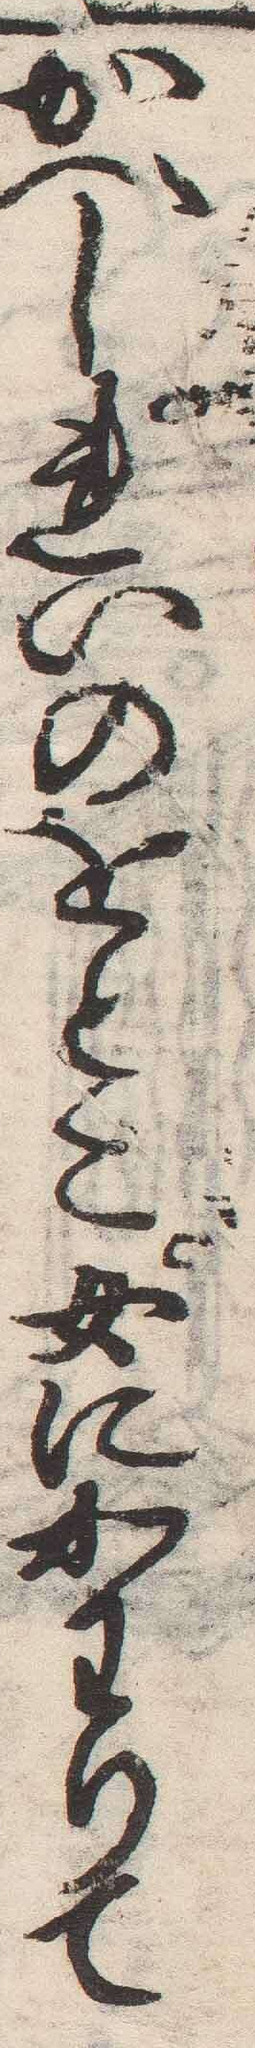かへし。れいのをとこ。女にかわりて
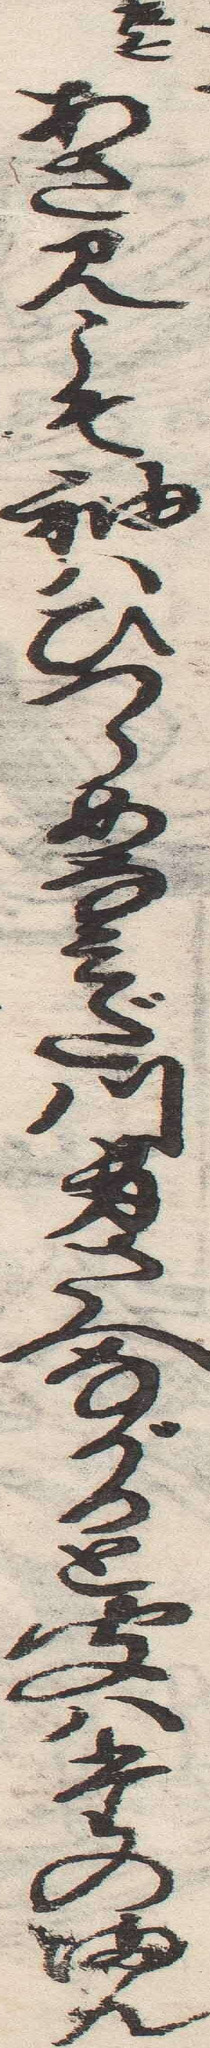古今あさみこそ袖はひつらめなみだ川身さへながると聞はたのまん
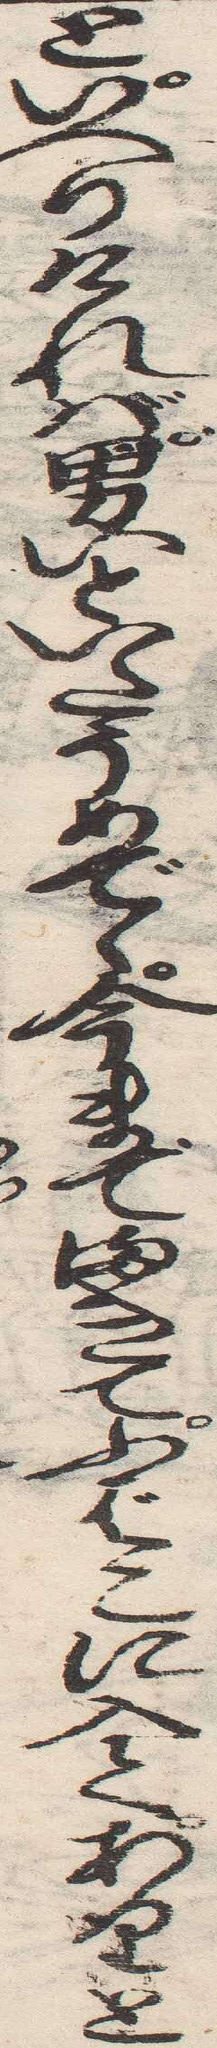と。いへりければ。男いといたうめでゝ。今までまきて。ふばこに入て。ありと
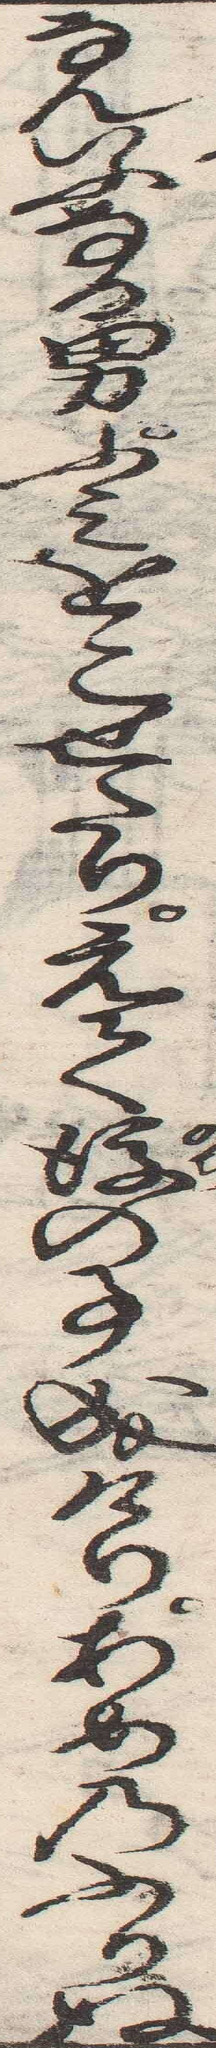なんいふなる男。ふみをこせたり。えて後の事成けり。あめのふりぬ
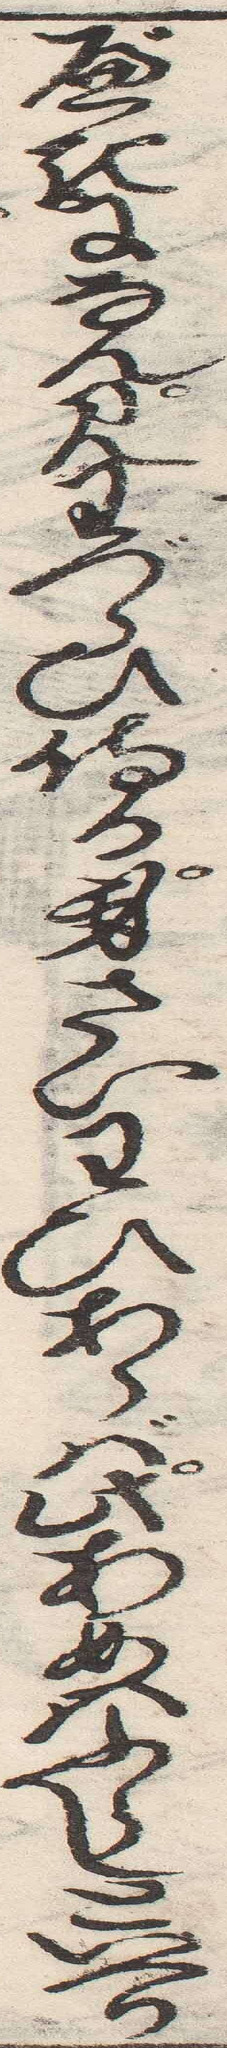べきになん。見わづらひ侍る。身さいわひあらば。此あめはふらしといへり
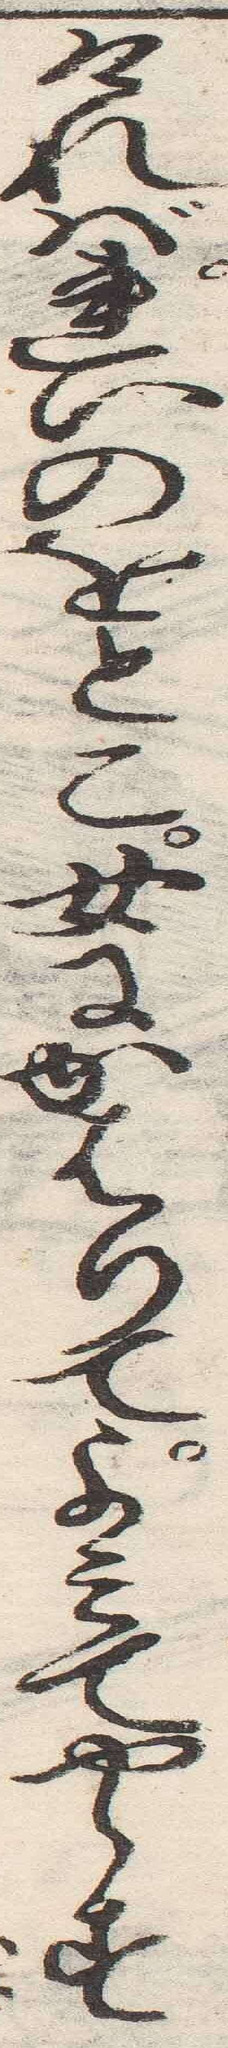ければ。れいのをとこ。女にかはりて。よみてやらす
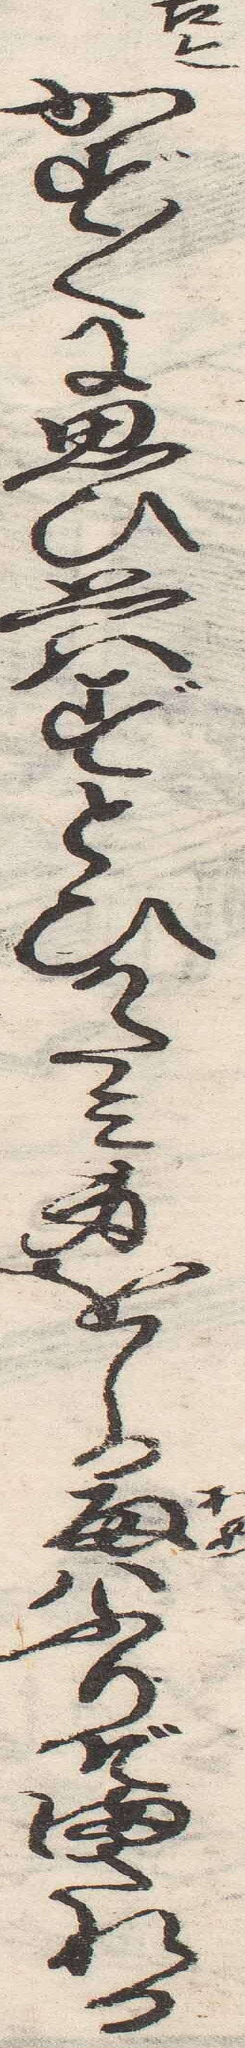古今かず〳〵に思ひ思はずとひかたみ身をしる雨はふりぞまされる
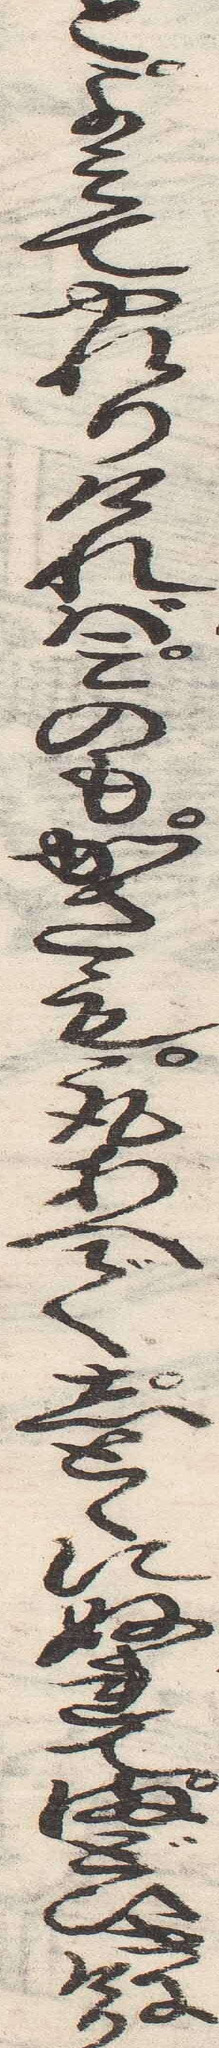と。よみてやれりければ。みのも。かさも。取あへで。しとゝにぬれてまどひきにけり
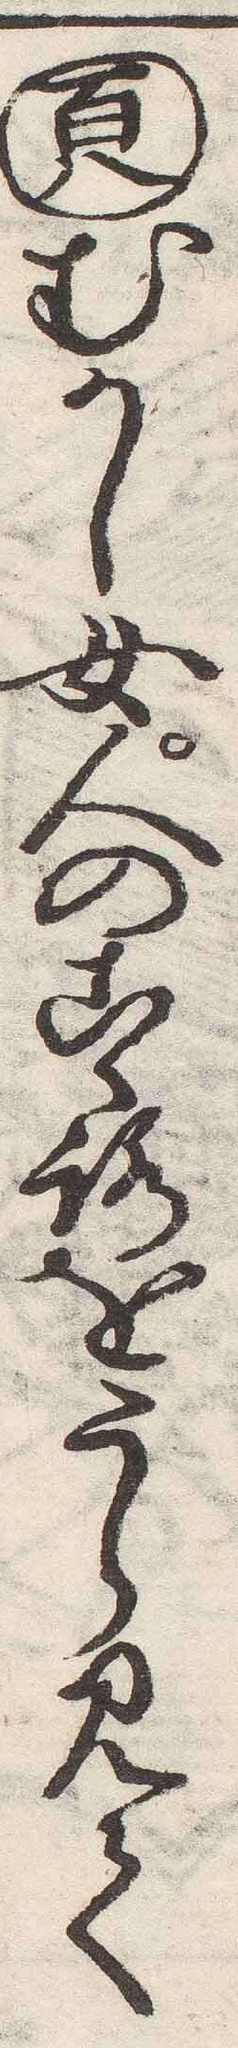百八むかし女。人のこゝろをうらみて
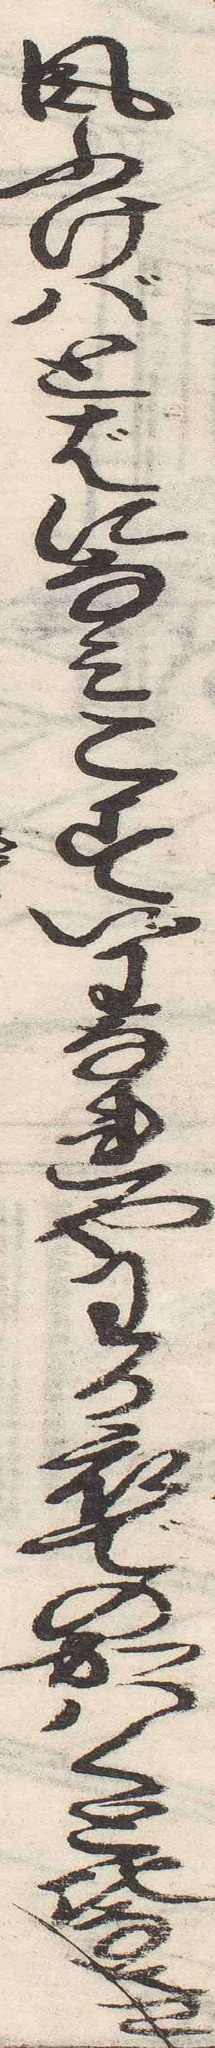風ふけばとばになみこすいわなれやわか衣でのかはくときなき
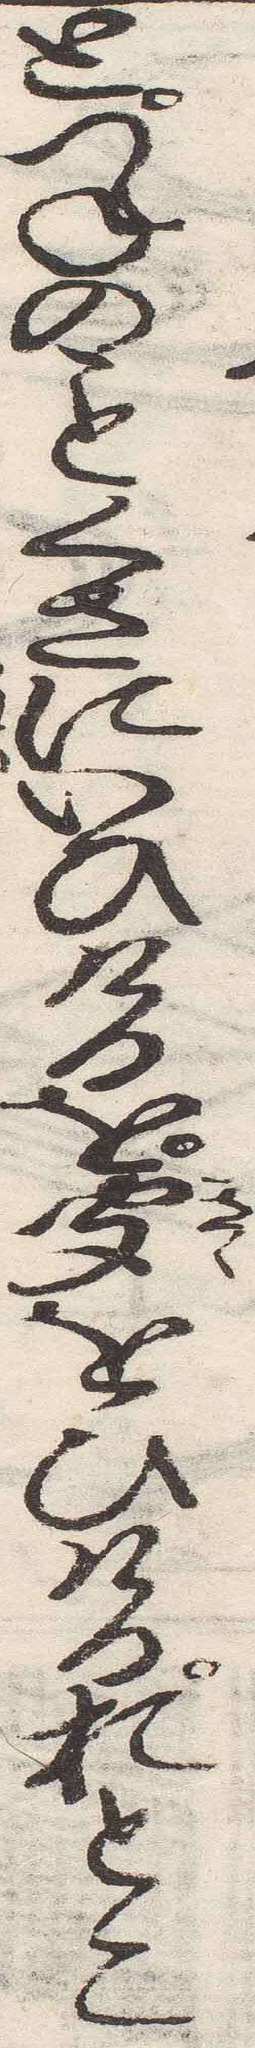と。つねのことくさにいひけるを。聞をひける。おとこ
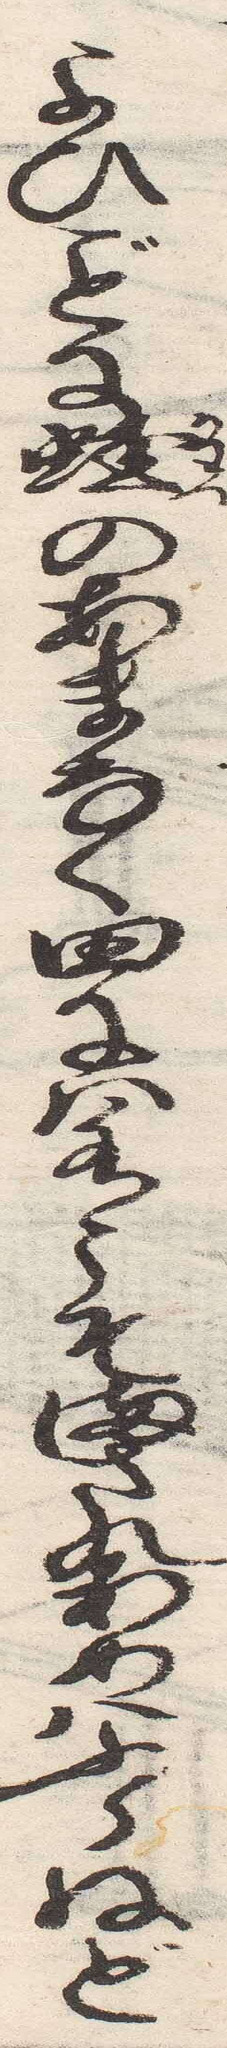よひごとに蛙のあま[た]なく田には水こそまされあめはふらねど
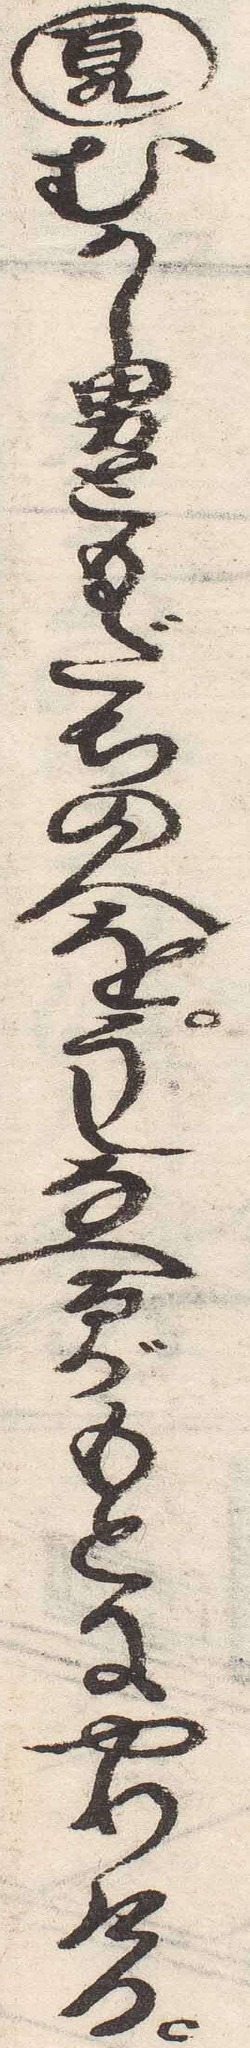百九むかし男ともだちの人を。うしなへるがもとにやりける。
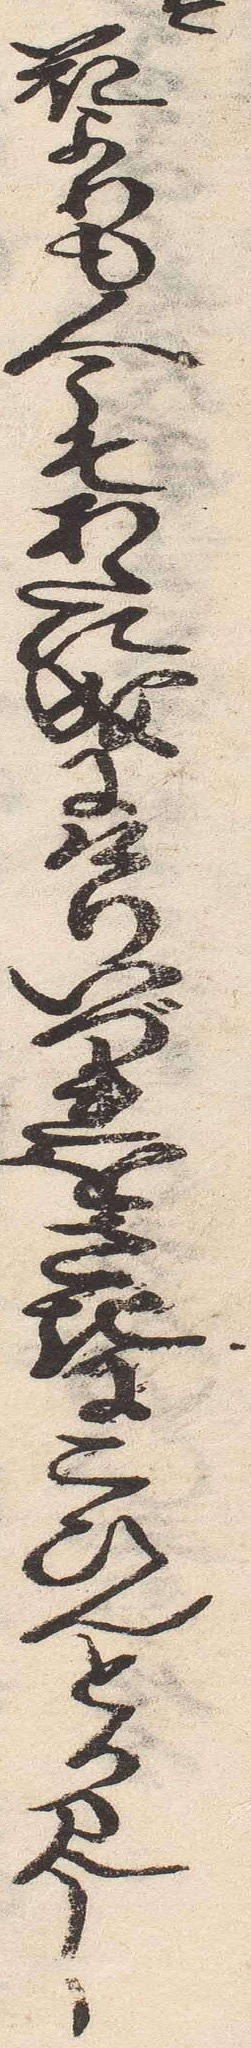古今花よりも人こそあたに成にけりいづれをさきにこひんとか見し
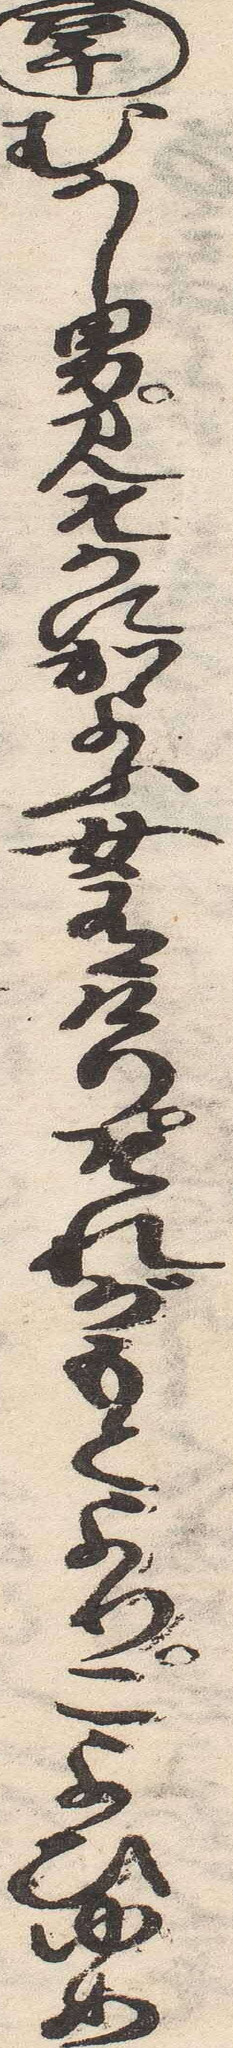百十むかし男。みそかにかよふ女有けり。それがもとより。こよひゆめ
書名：伊勢物語
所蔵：東京学芸大学附属図書館 国文学研究資料館
